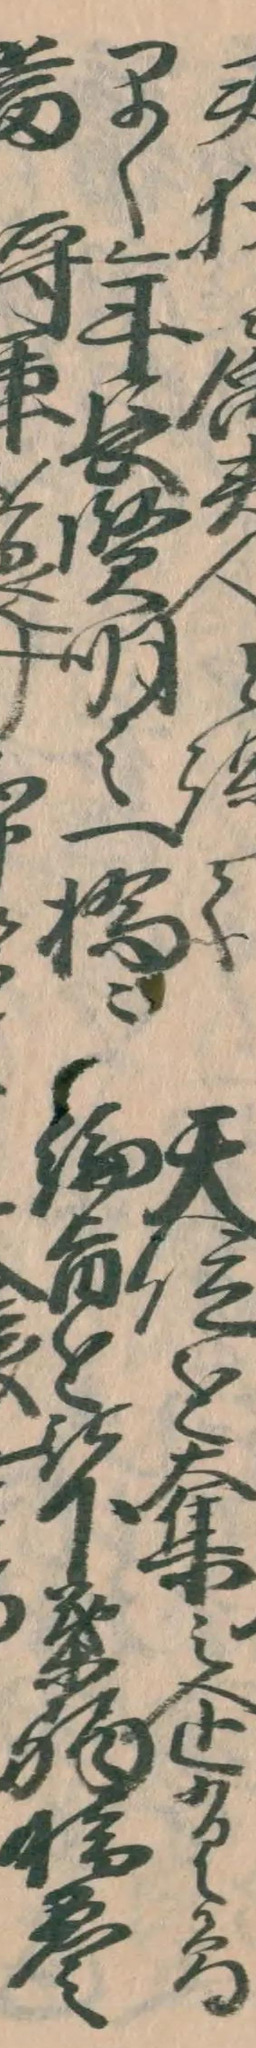早く年長賢明之一橋ニ綸旨を被下柔弱暗愚之
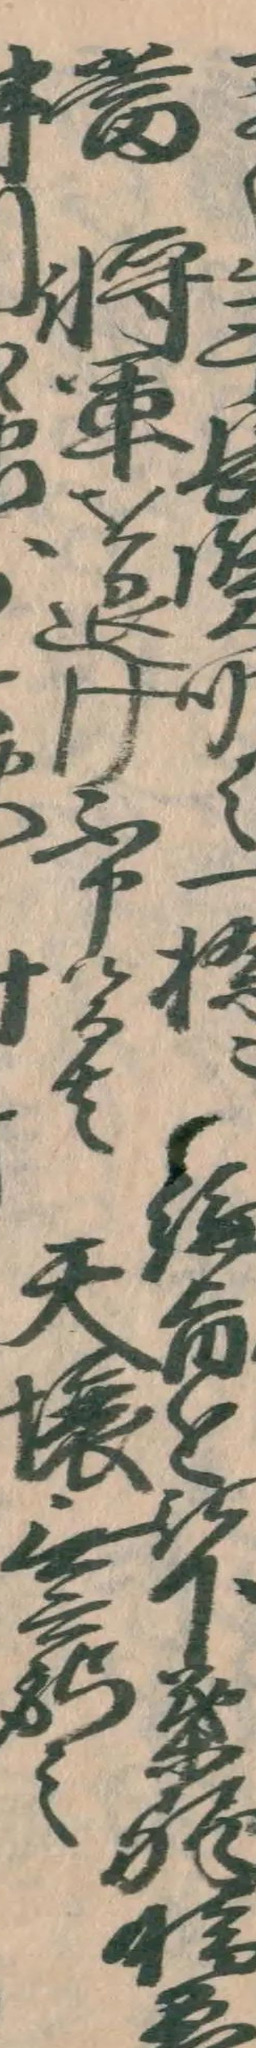當将軍を退け不申候而者天壌無窮之
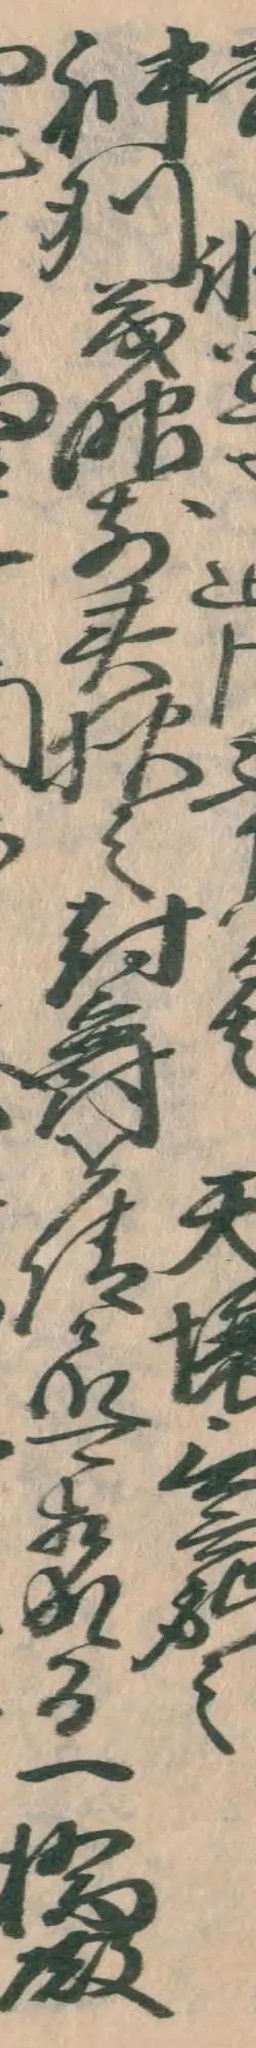神州茂眼前夷狄之封爵を請候様可相成候間一橋殿
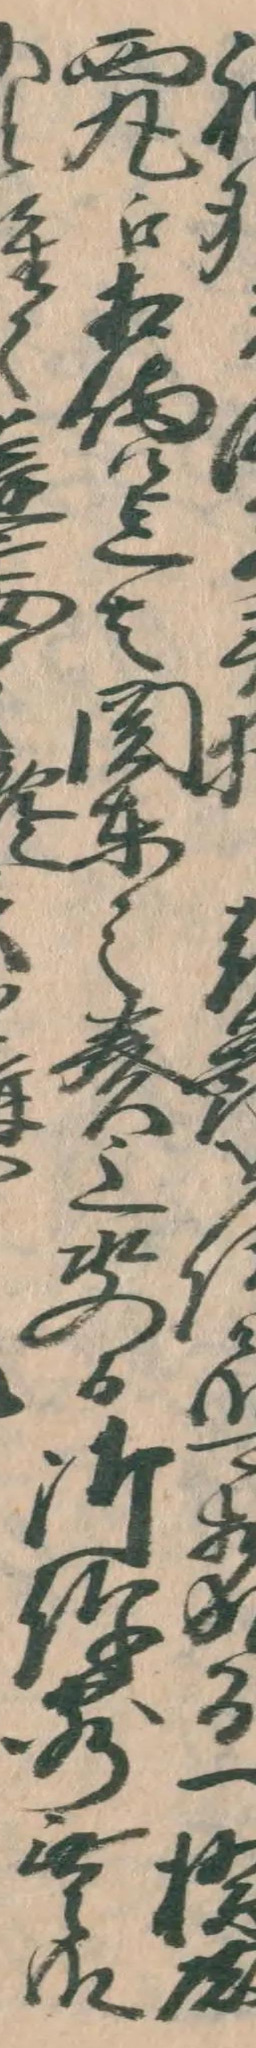西丸江相備候迄者関東之奏上決而御許容無之様
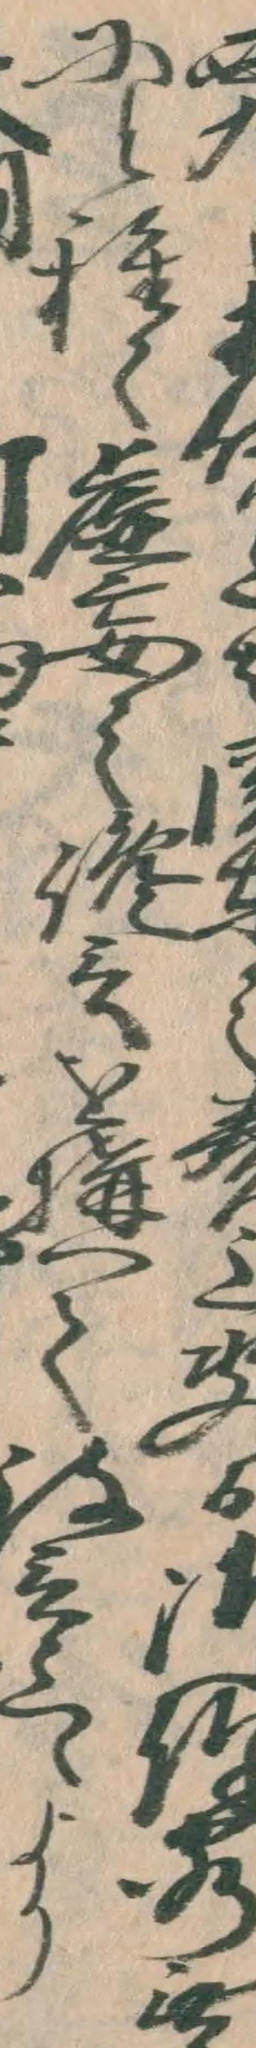にと種々虚妄之讒言を構へて致言上候より
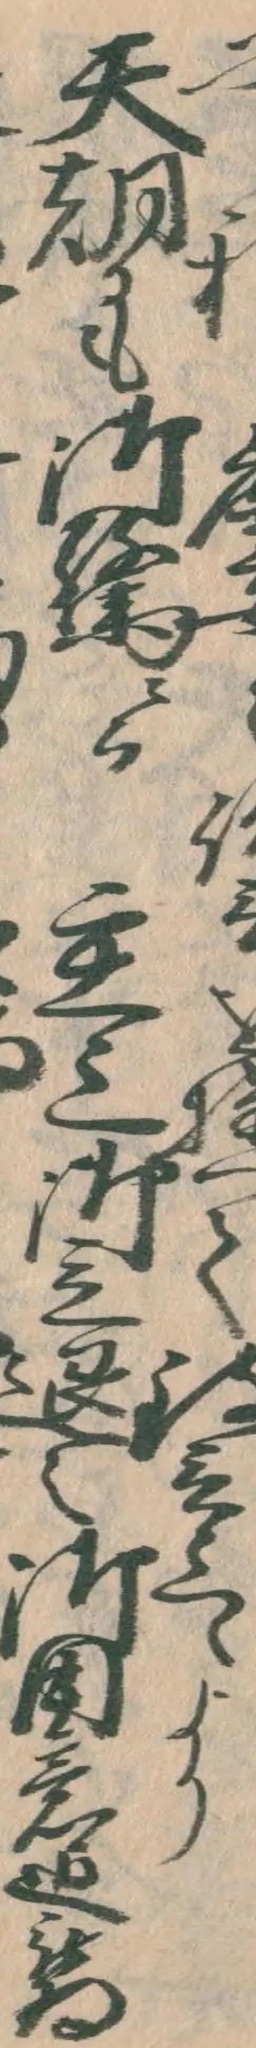天朝にも御驚ニ而主上御立退之御用意迄被為
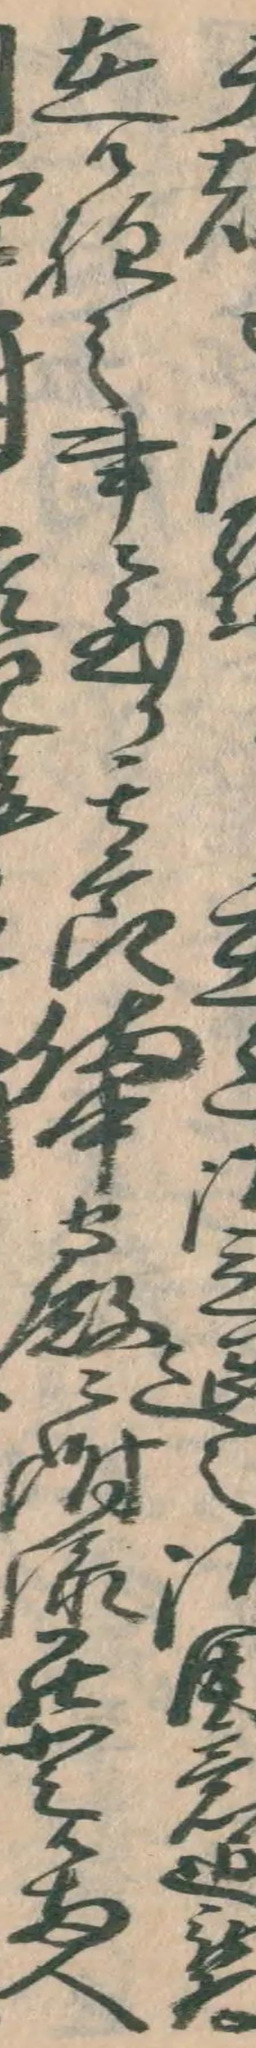在候程之事ニ至り其節備中守殿ニ附添罷登候両人
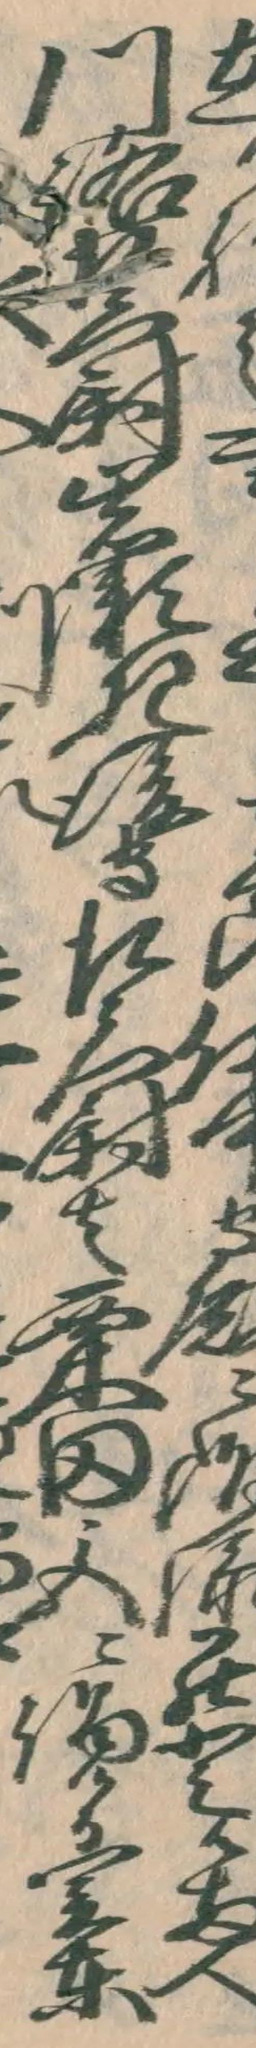川路左衛門尉岩瀬肥後守左衛門尉者粟田宮ニ詣ける関東
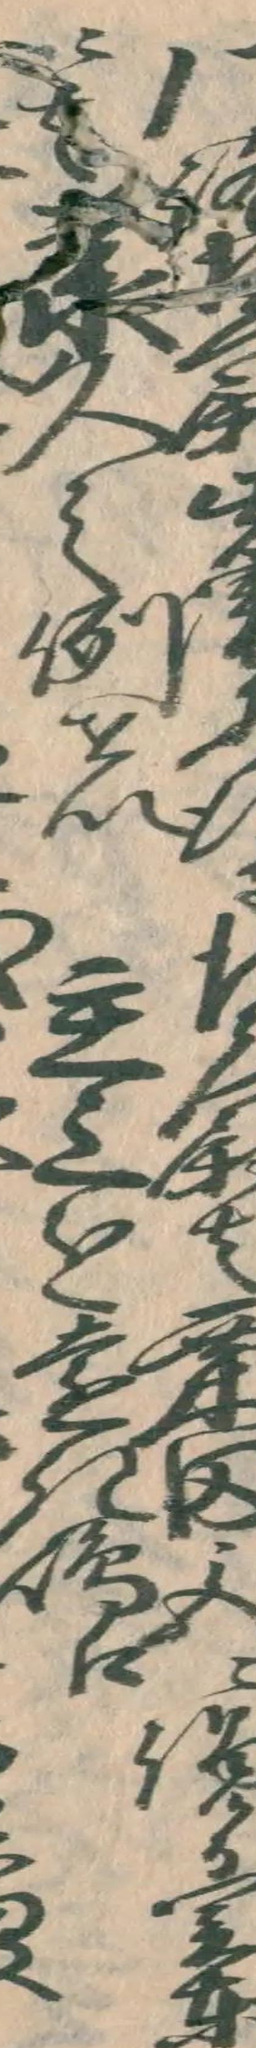ニ者承久之例を以主上を遠き嶋江
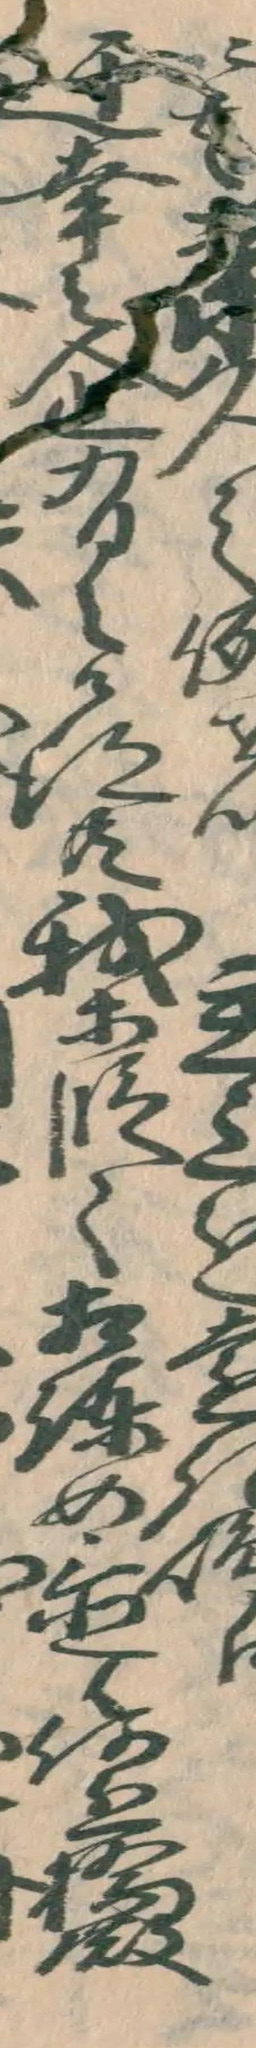遷幸之企有之候得共我等段々相諫め置候何分一橋殿
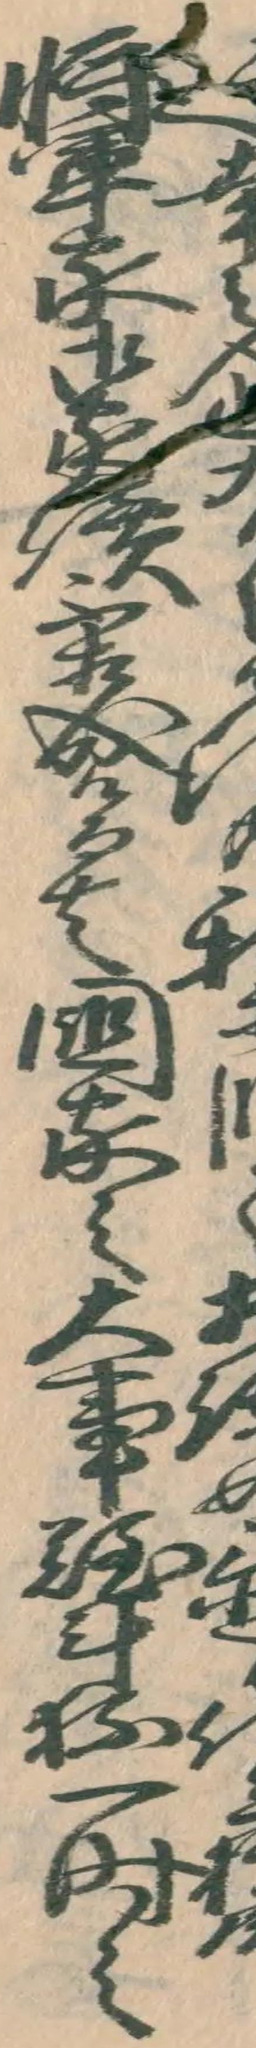将軍家御家続不相成候而者国家之大事難斗抔一時之

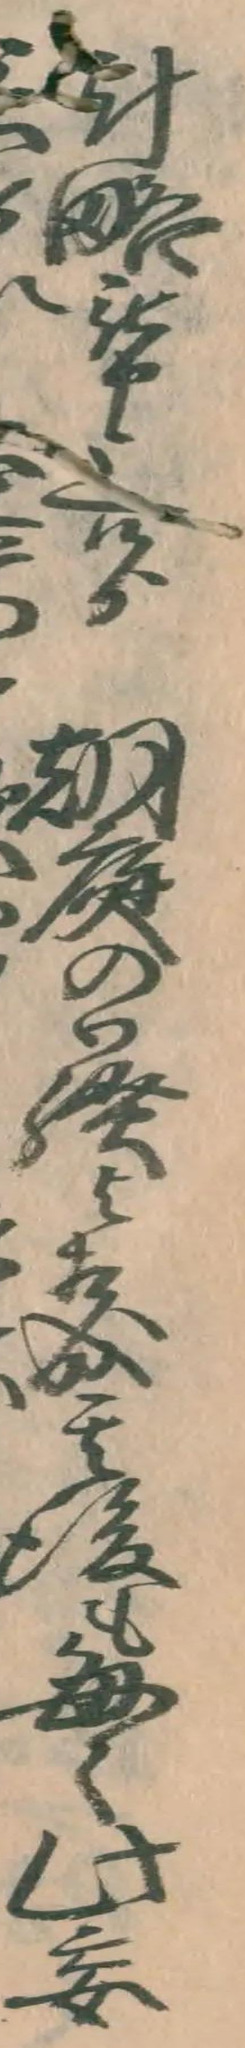計略被申上候ゟ朝庭の御騒と相成其後も毎々此妄
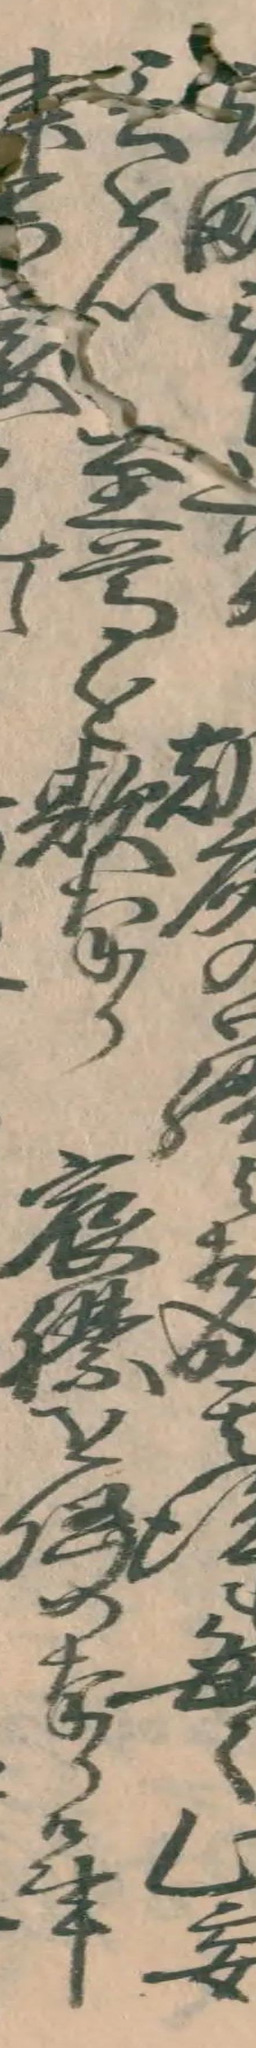言を以至尊を欺奉り宸襟を悩め奉り候事
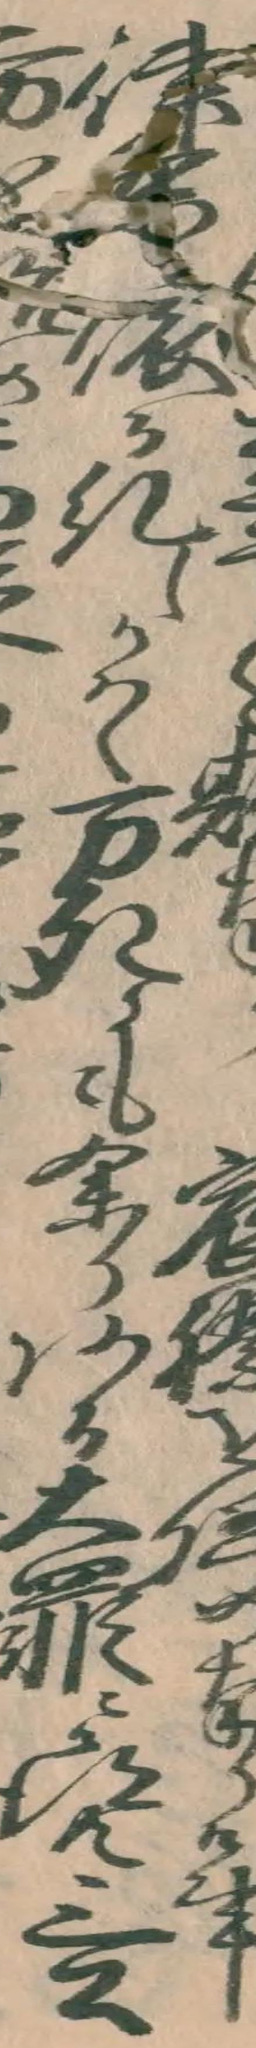律条ニ依而糺し候ハヽ万死にも余りある大罪ニ候得共三公
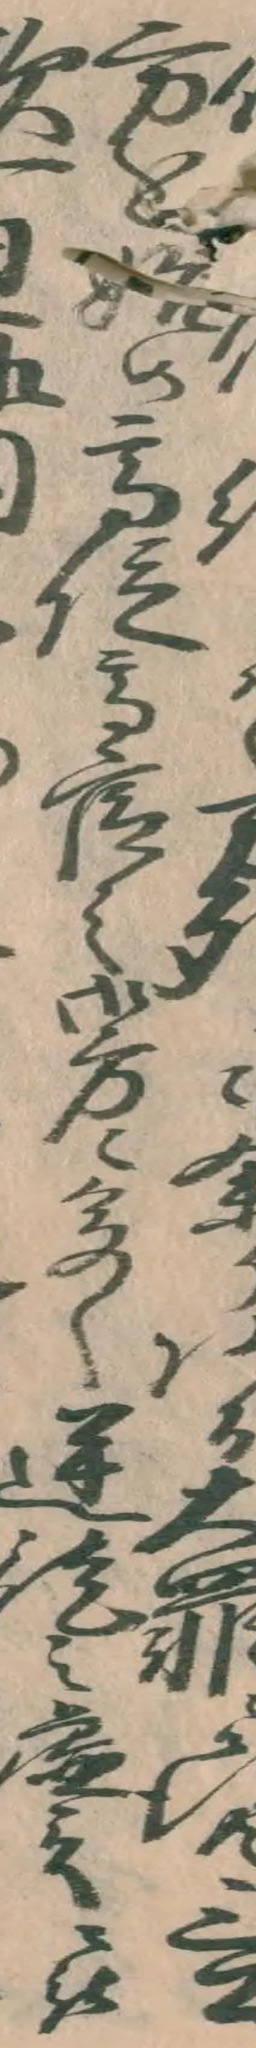方を始め高位高官之御方々多く逆徒之虚言ニ被
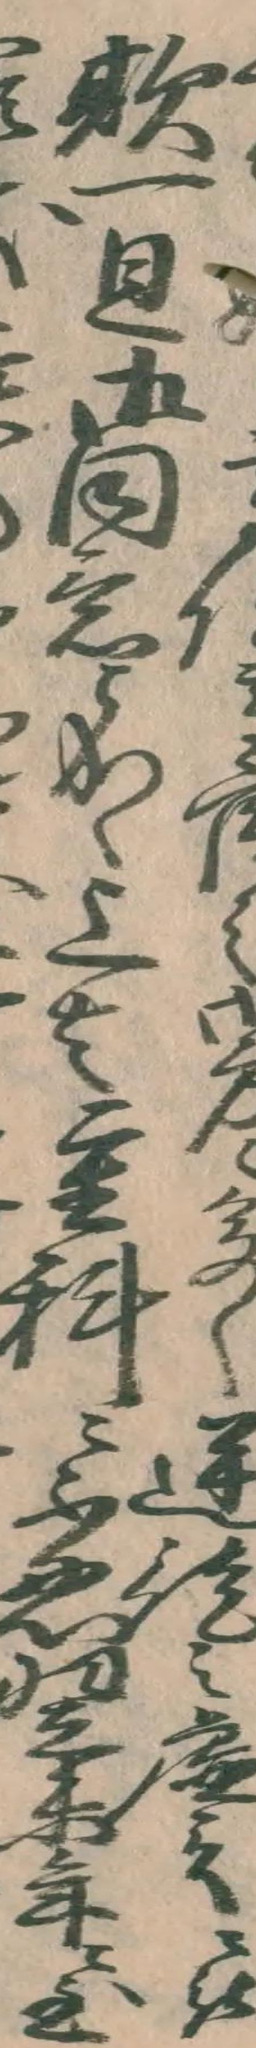欺一旦御同意被成候上者重科ニ不忍翌未年二至
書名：麗斎叢書. 20
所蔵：国立国会図書館 National Diet Library, JAPAN
